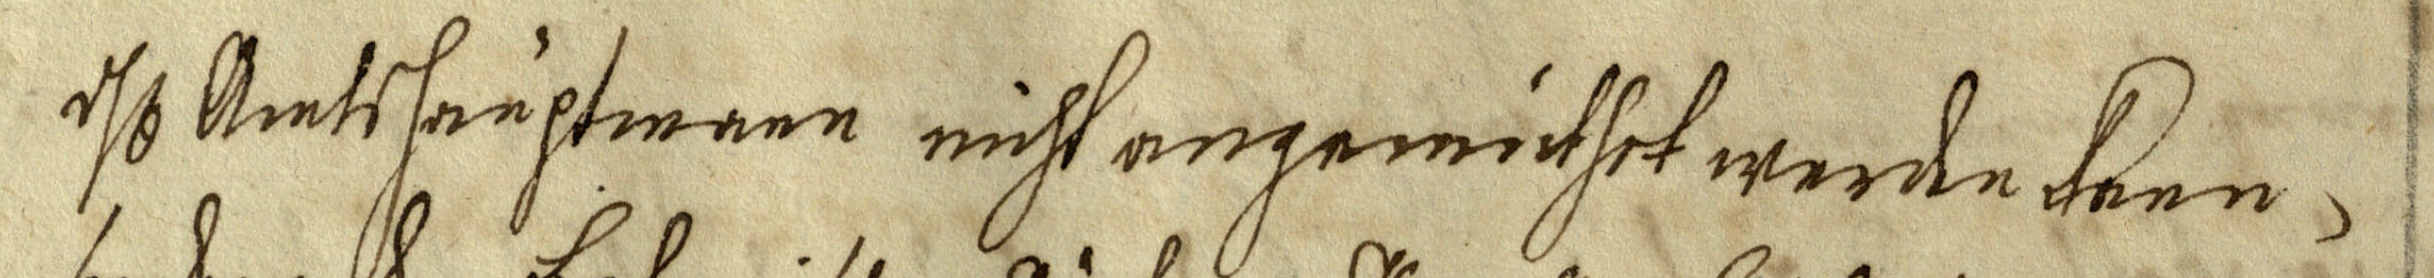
dh Amtshauptmann nicht angemiethet werden kann,
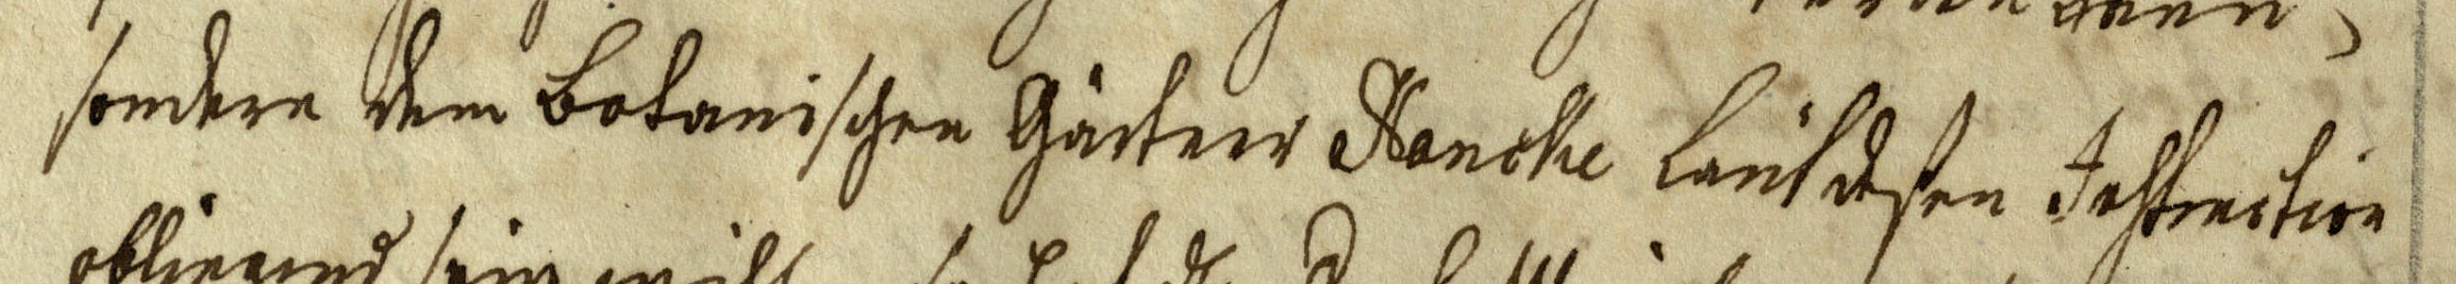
sondern dem Botanischen Gärtner Hancke laut deßen Instruction
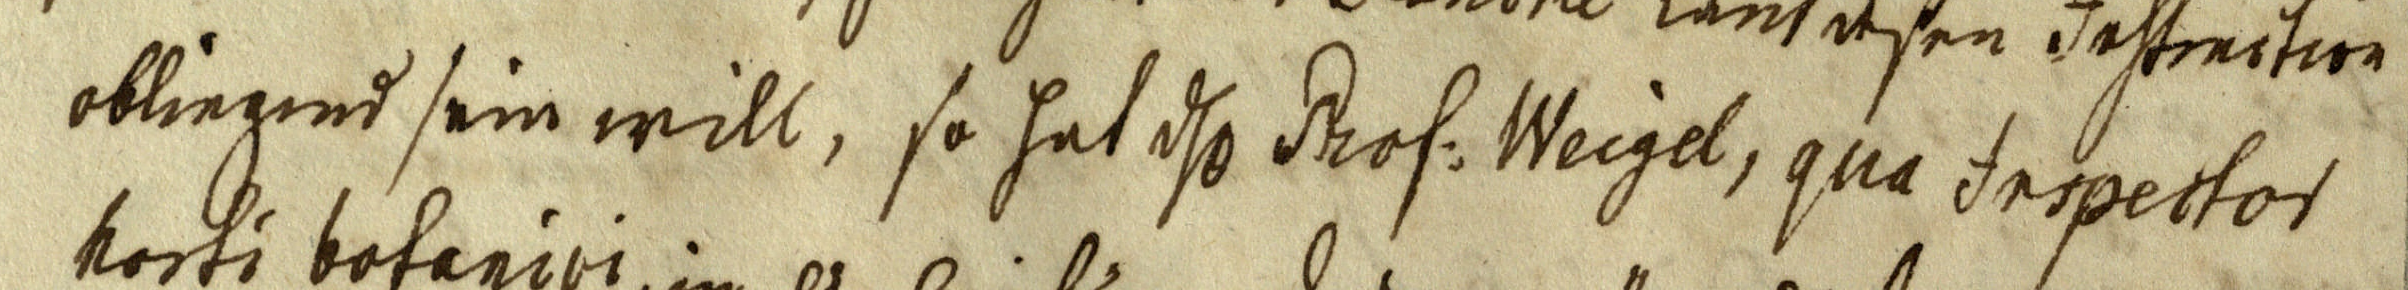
obliegend sein will, so hat dh Prof. Weigel, qua Inspector
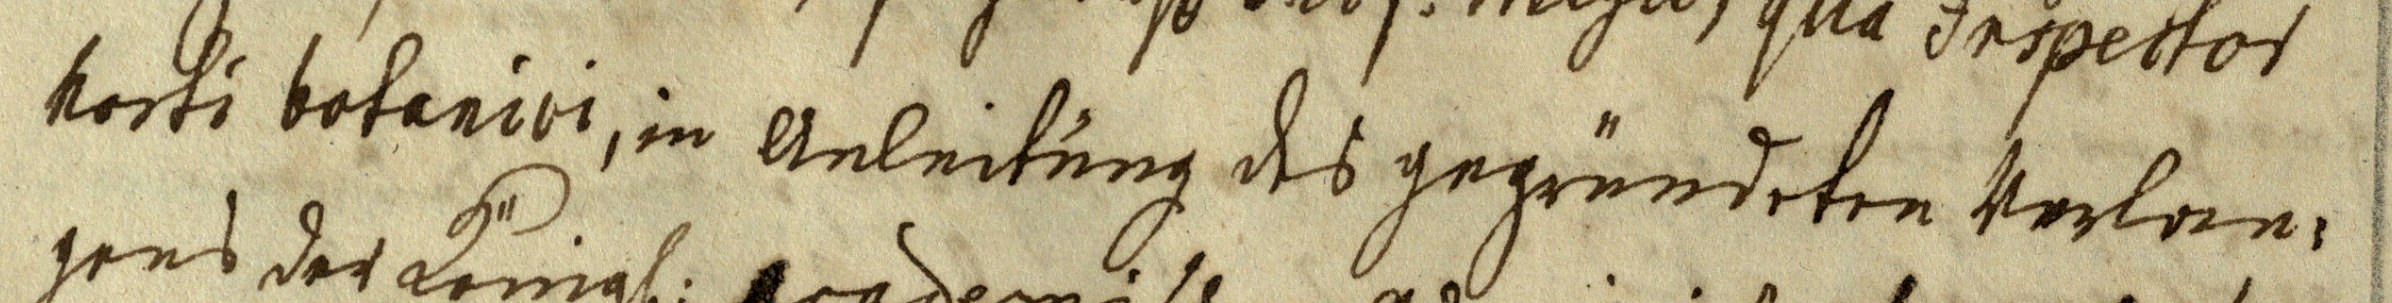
horti botanici, in Anleitung des gegründeten Verlan¬
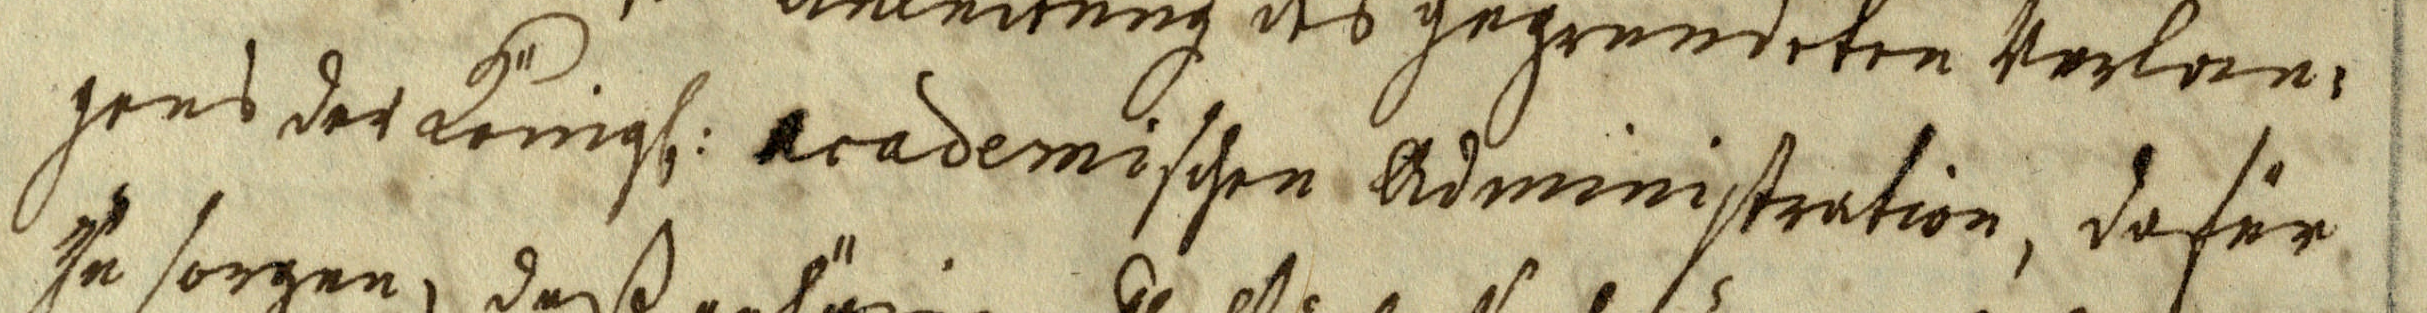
gens der Königl. Academischen Administration, dafür
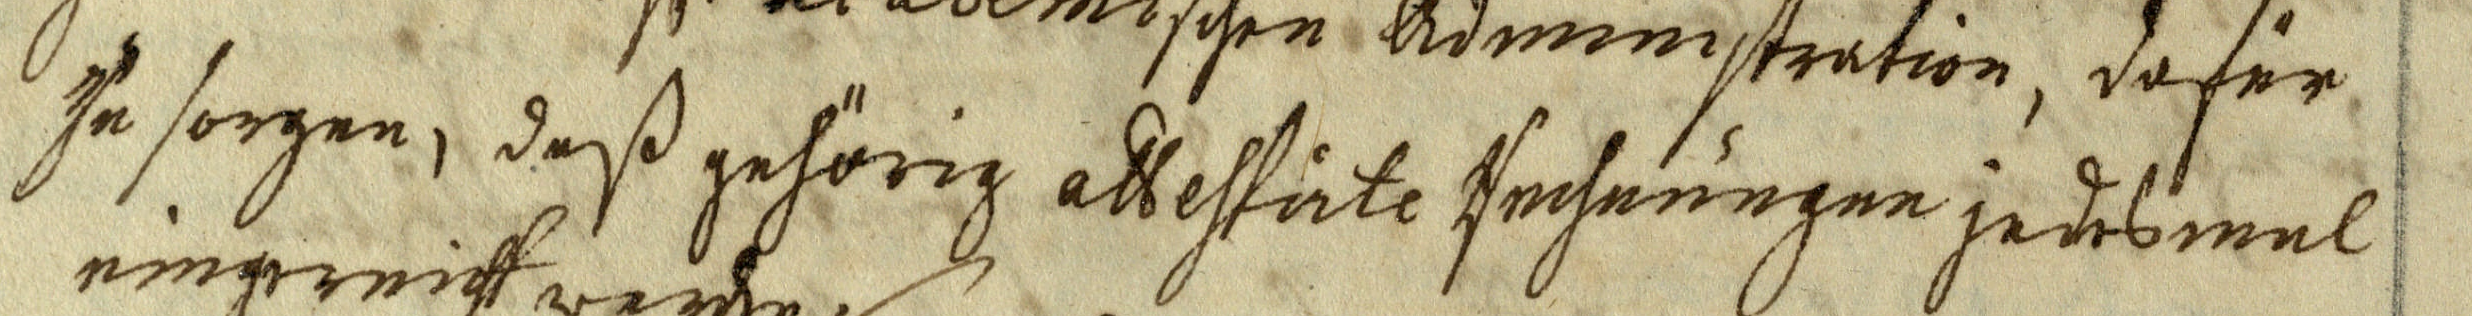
zu sorgen, daß gehörig attestirte Rechnungen jedesmal
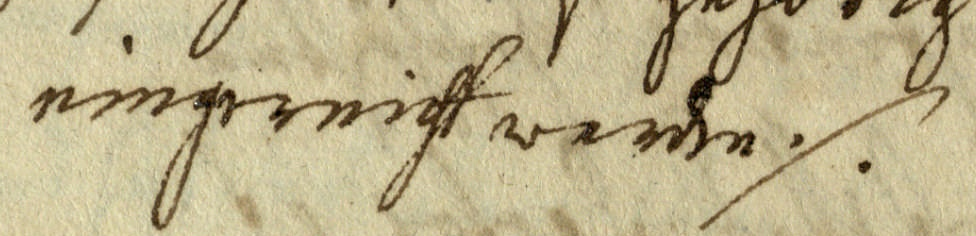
eingereicht werden.
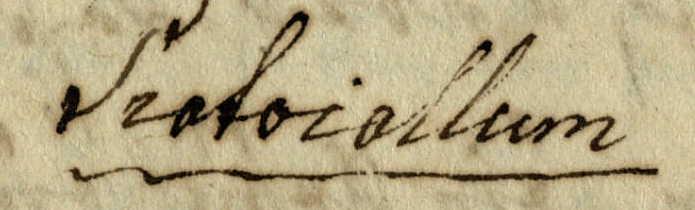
Protocollum
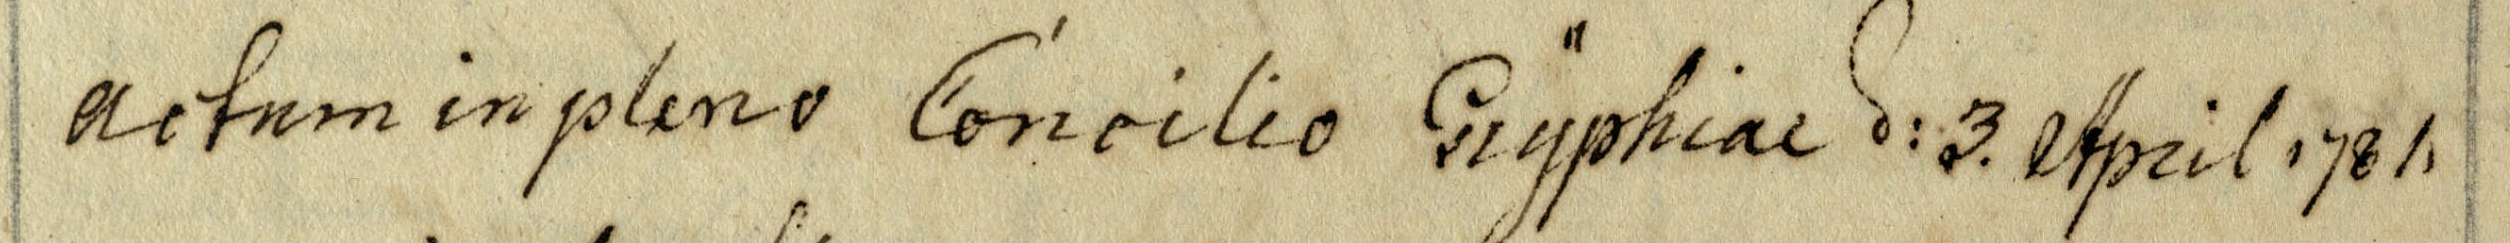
Actum in pleno Concilio Grÿphiae d. 3. April 1871.
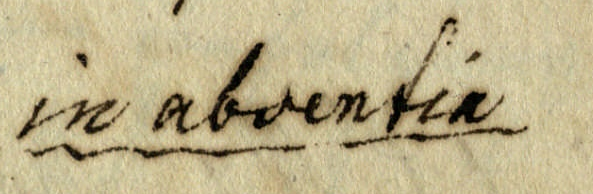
in absentia
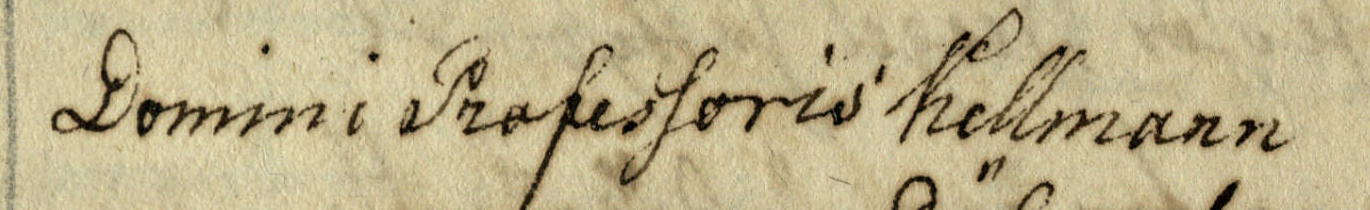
Domini Professoris Kellmann
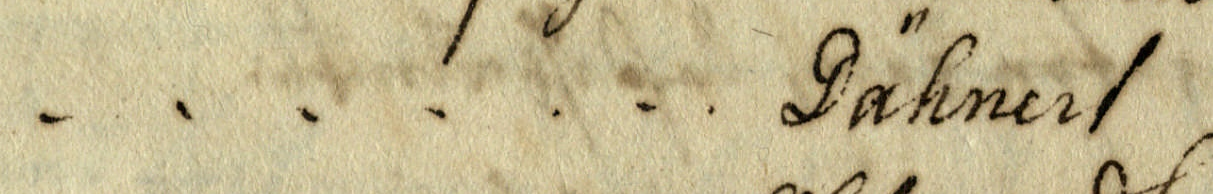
Dähnert
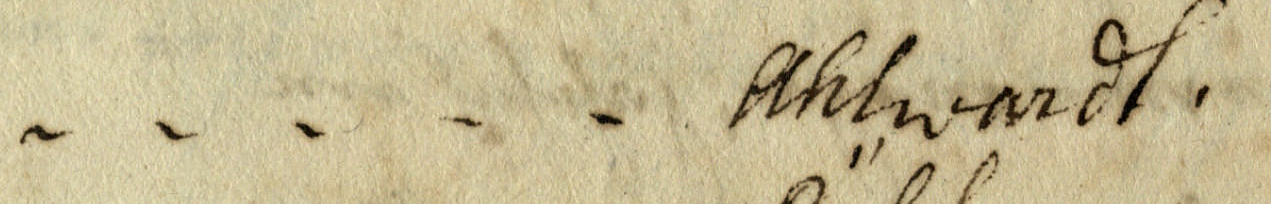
Ahlwardt.
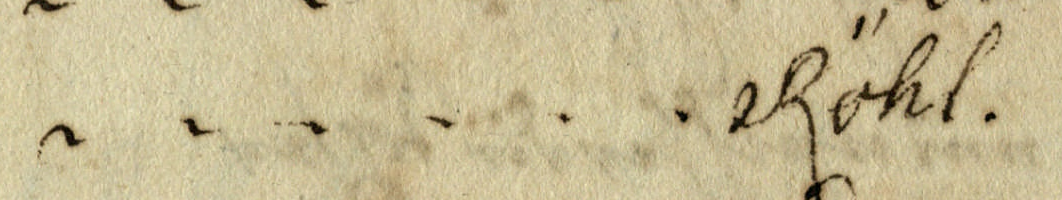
Röhl.
